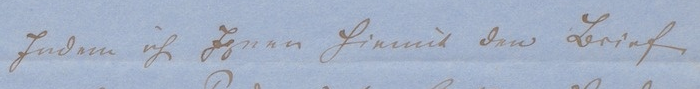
Indem ich Ihnen hiemit den Brief
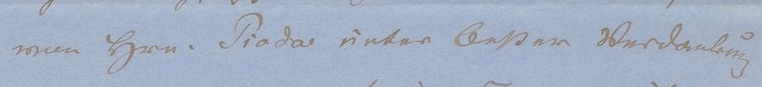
von Hrn. Pioda unter bester Verdankung
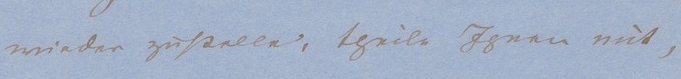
wieder zustelle, theile Ihnen mit,
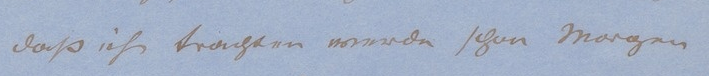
daß ich trachten werde schon Morgen
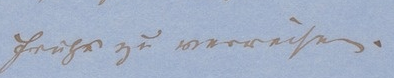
frühe zu verreisen.
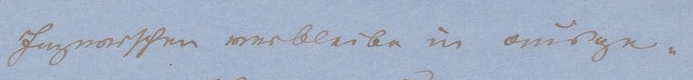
Inzwischen verbleibe in ausge-
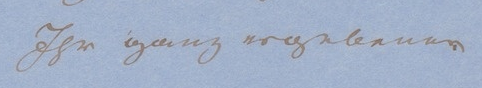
Ihr ganz ergebener
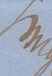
J.
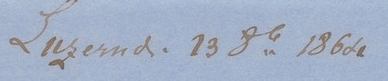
Luzern d. 13 8b 1864
